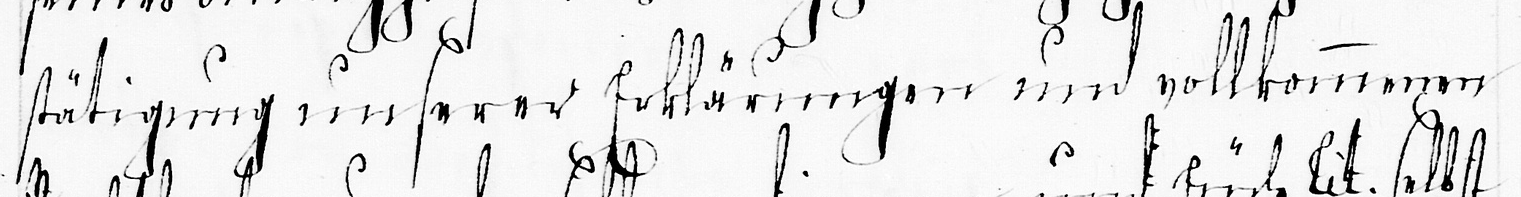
stätigung unserer Erklärungen und vollkommenen
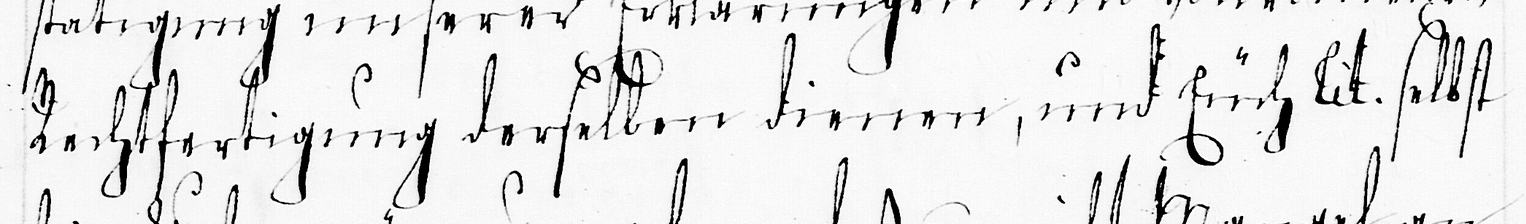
Rechtfertigung derselben dienen, und Euch Tit. selbst
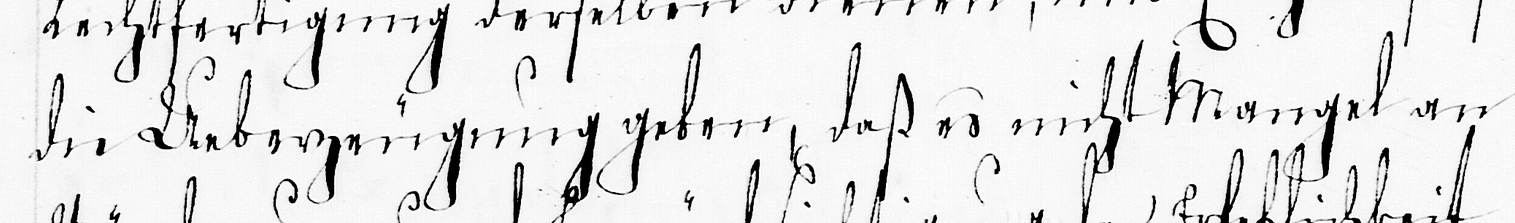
die Ueberzeugung geben, daß es nicht Mangel an
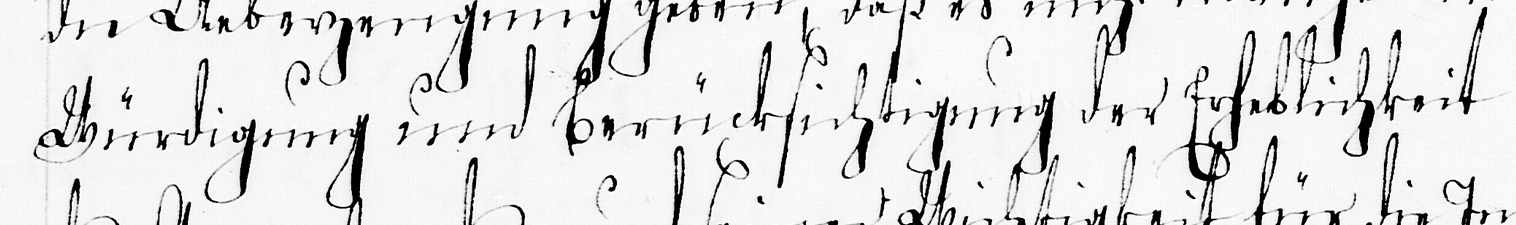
Würdigung und Berücksichtigung der Erheblichkeit
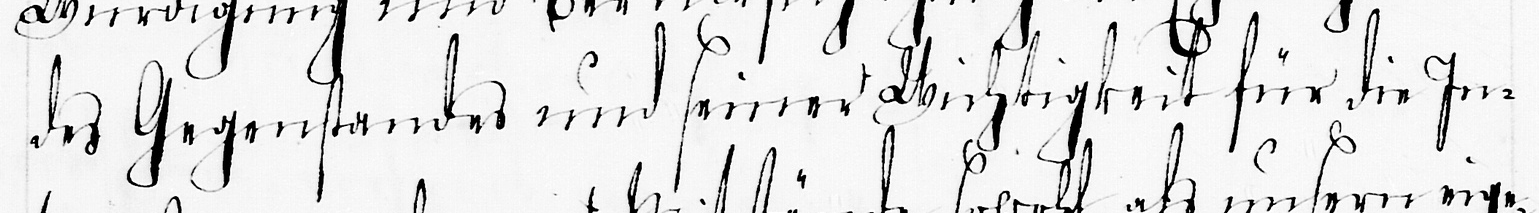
des Gegenstandes und seiner Wichtigkeit für die In¬
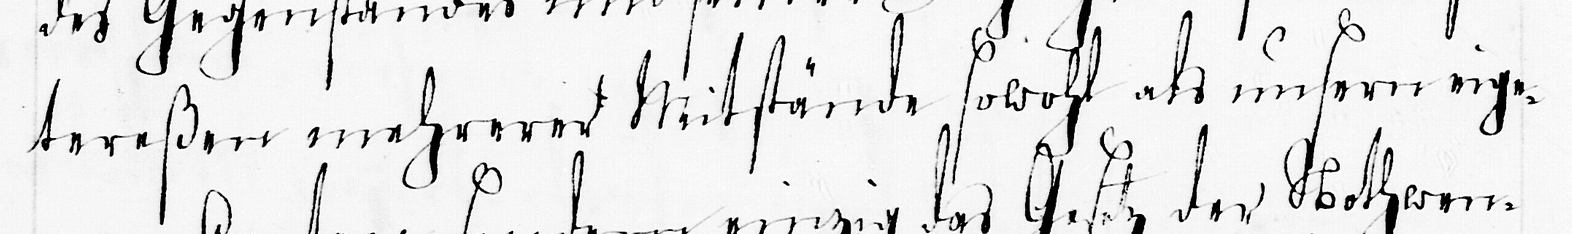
tereßen mehrerer Mitstände sowohl als unsern eige¬
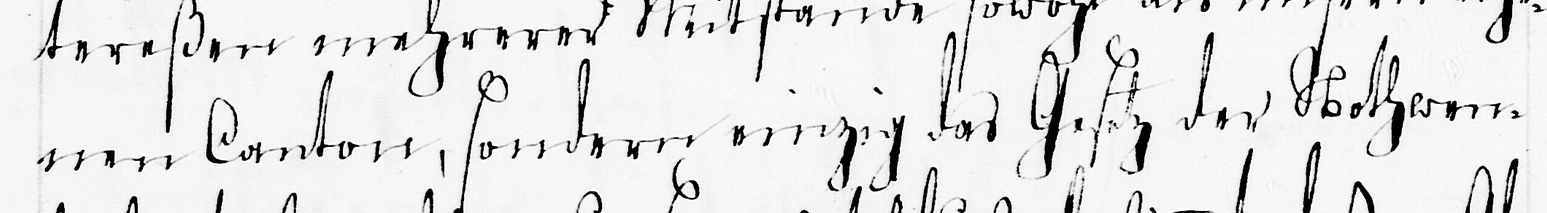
nen Canton, sondern einzig das Gesetz der Nothwen¬
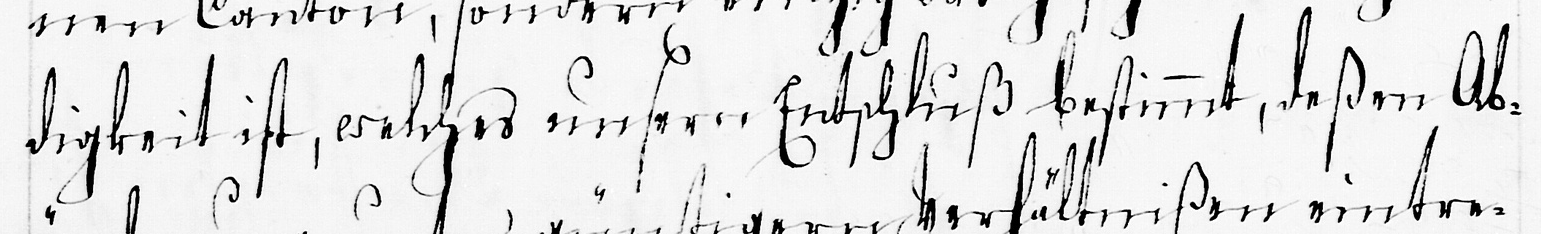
digkeit ist, welches unsern Entschluß bestimmt, deßen Ab¬
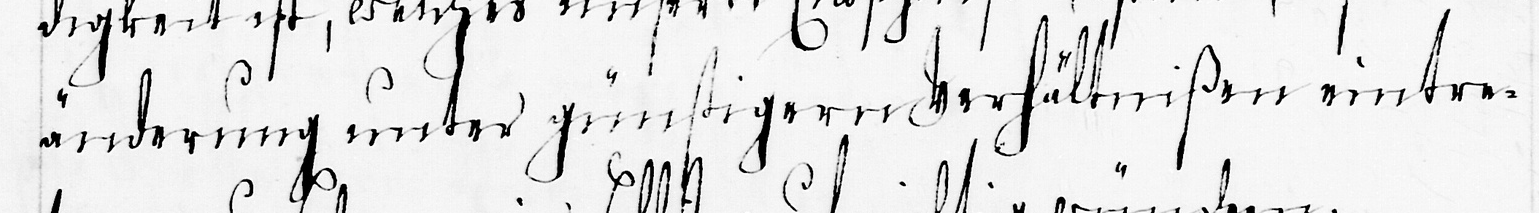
änderung unter günstigern Verhältnißen eintre¬
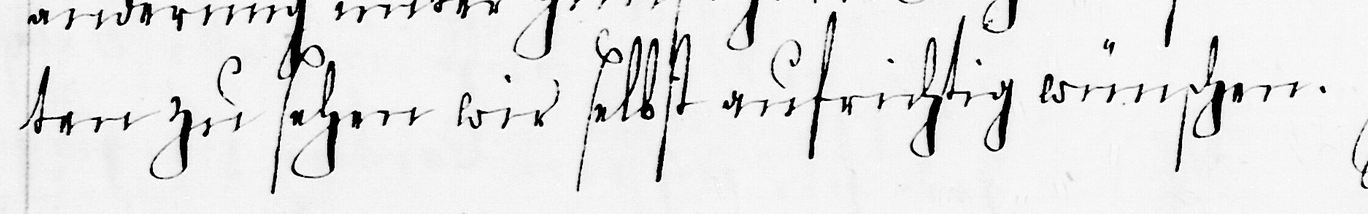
ten zu sehen wir selbst aufrichtig wünschen.
